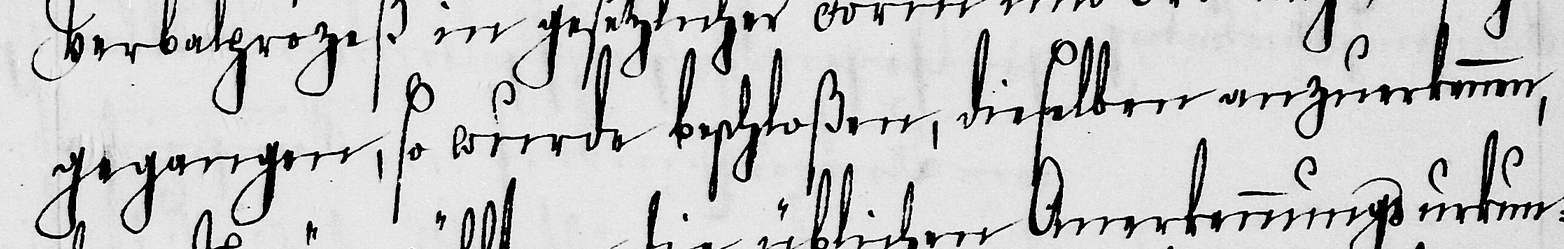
gegangen, so wurde beschloßen, dieselben anzuerkenne¬
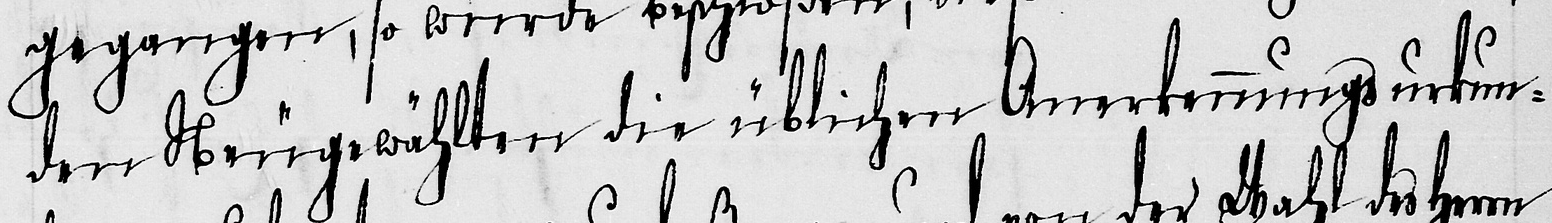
den Neugewählten die üblichen Anerkennungsurkun¬
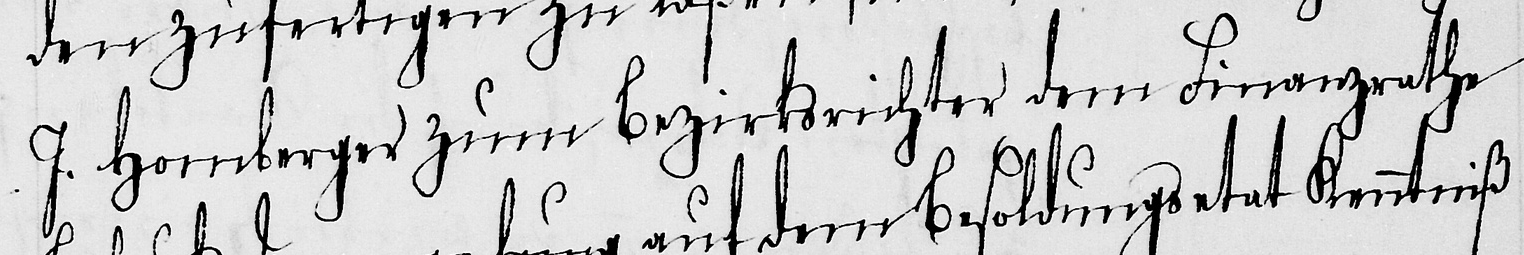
J. Homberger zum Bezirksrichter dem Finanzrathe
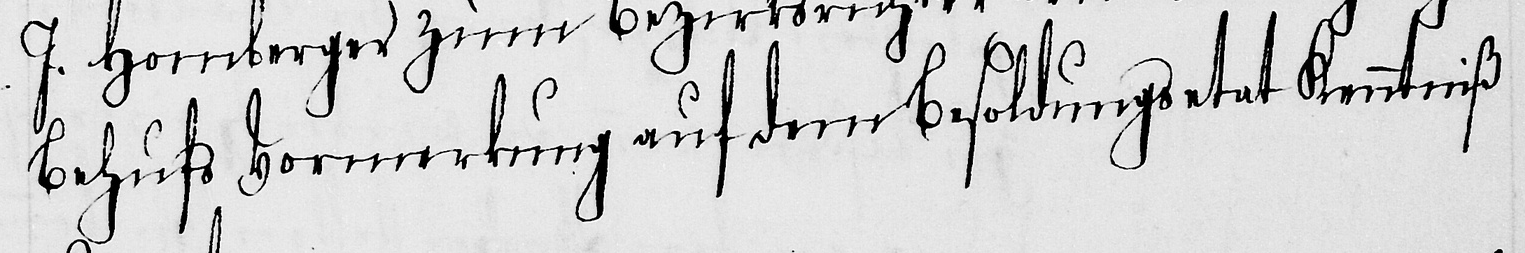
Behufs Vormerkung auf dem Besoldungsetat Kenntniß
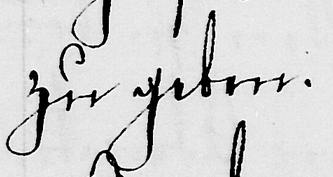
zu geben.
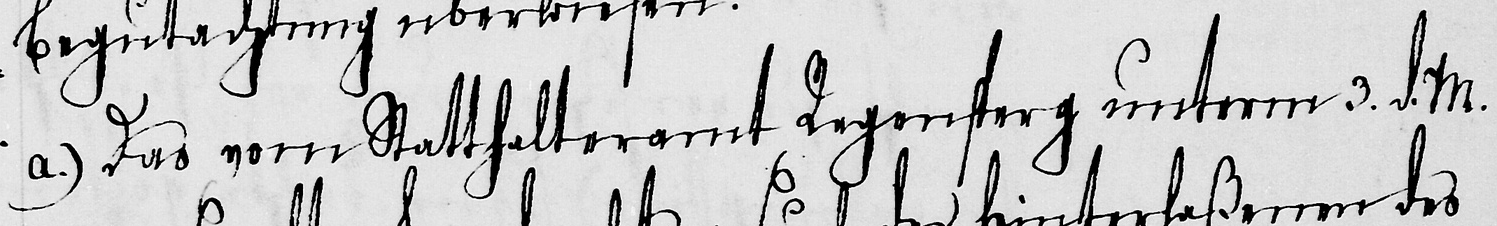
a.) Das vom Statthalteramt Regensperg unterm 3. d. M.
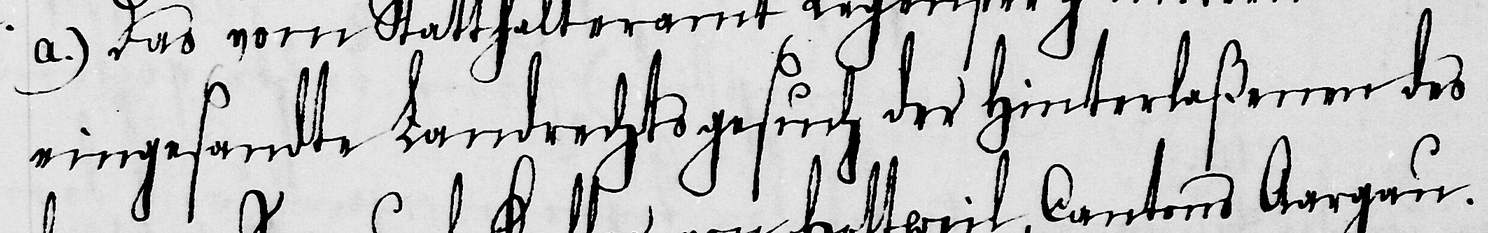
eingesandte Landrechtsgesuch der Hinterlaßenen des
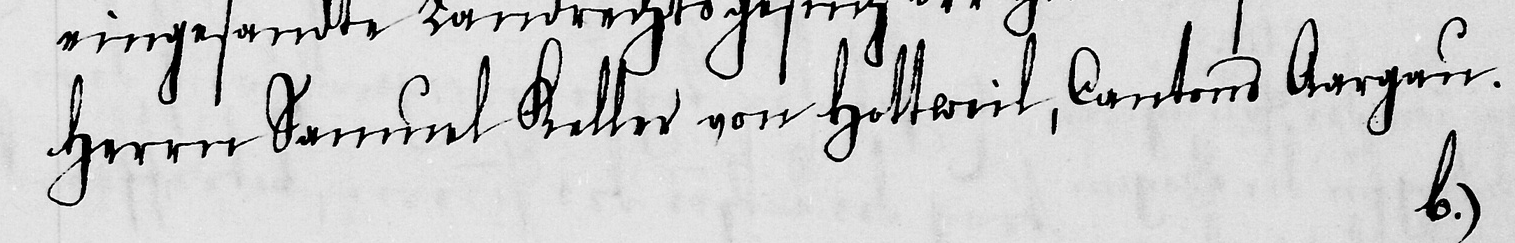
Herrn Samuel Keller von Hottweil, Cantons Aargau.
